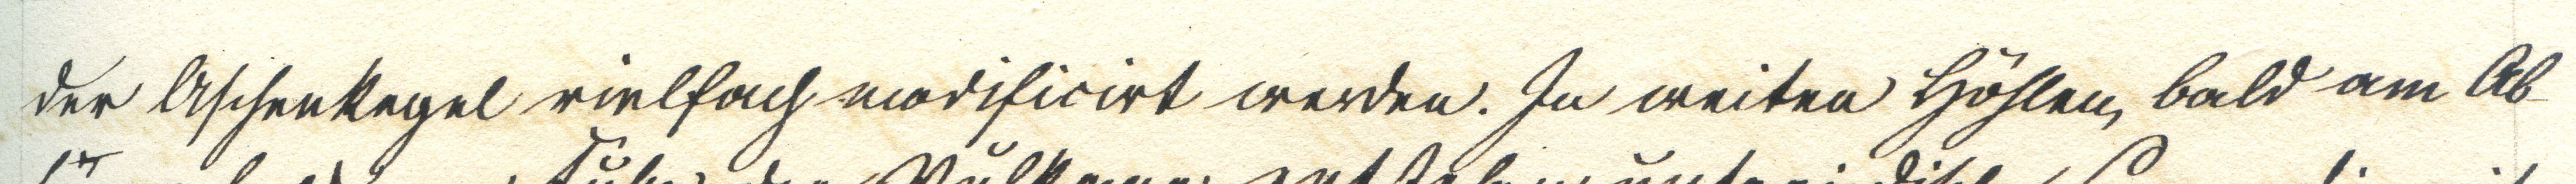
der Aschenkegel vielfach modificirt werden. In weiten Höhlen, bald am Ab-
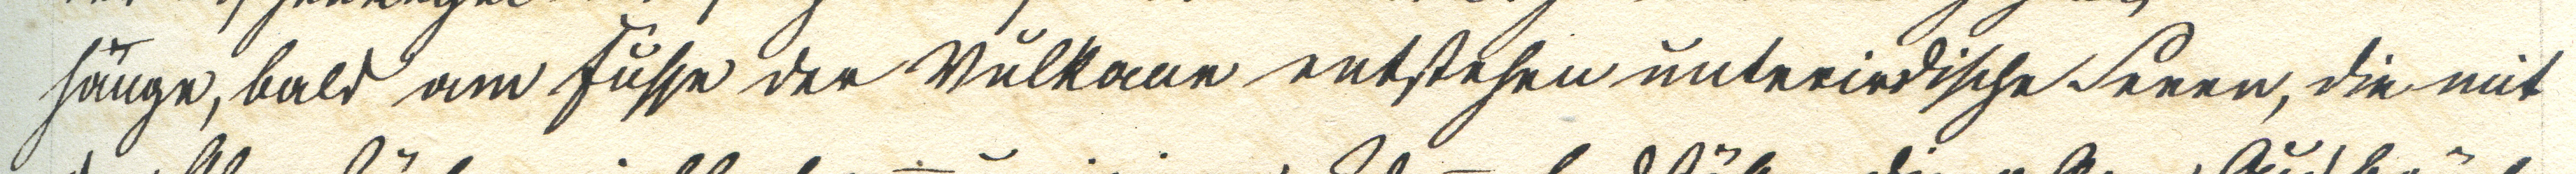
ha￼nge, bald am Fusse der Vulkane entstehen unterirdische Seeen, die mit
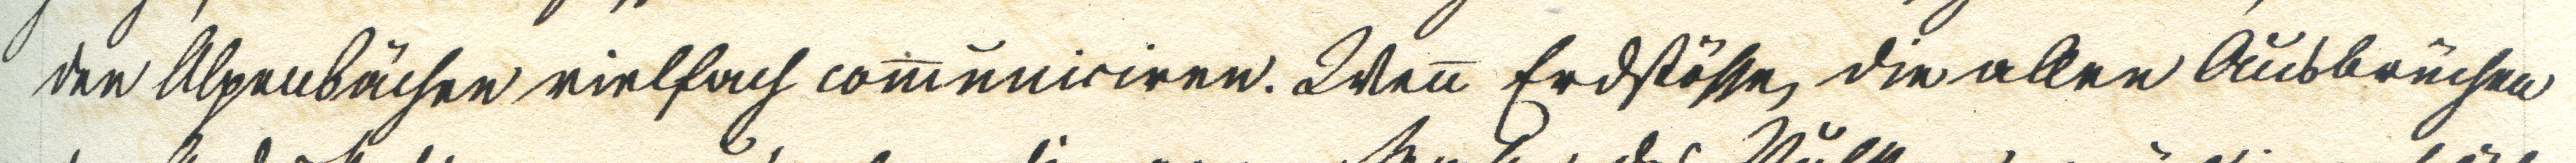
den Alpenbächen vielfach com̃uniciren. Weñ Erdstösse, die allen Ausbrüchen
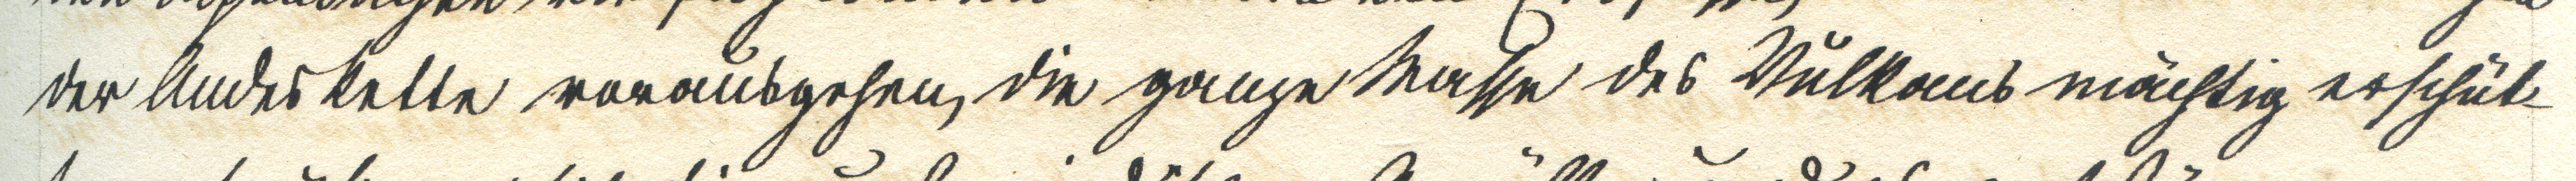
der Andeskette vorausgehen, die ganze Masse des Vulkans mächtig erschüt-
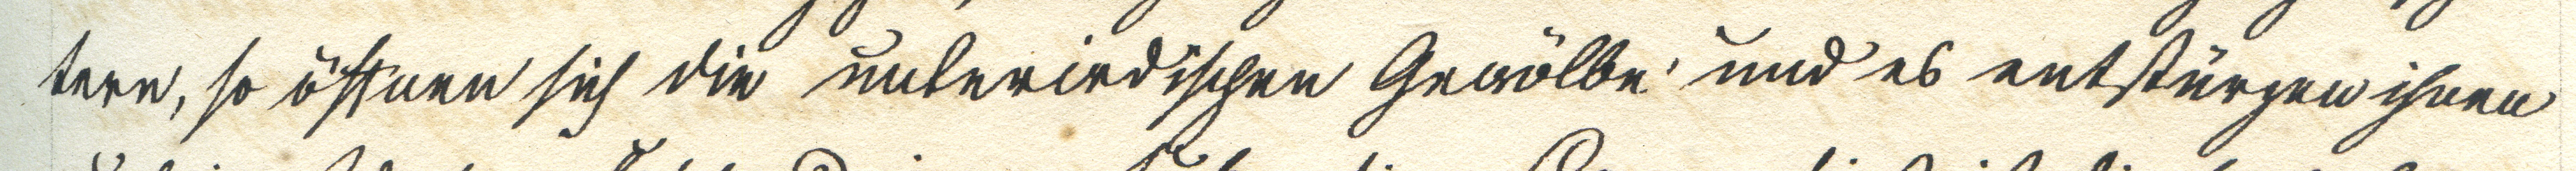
tern, so öffnen sich die unterirdischen Gewölbe und es entstürzen ihnen
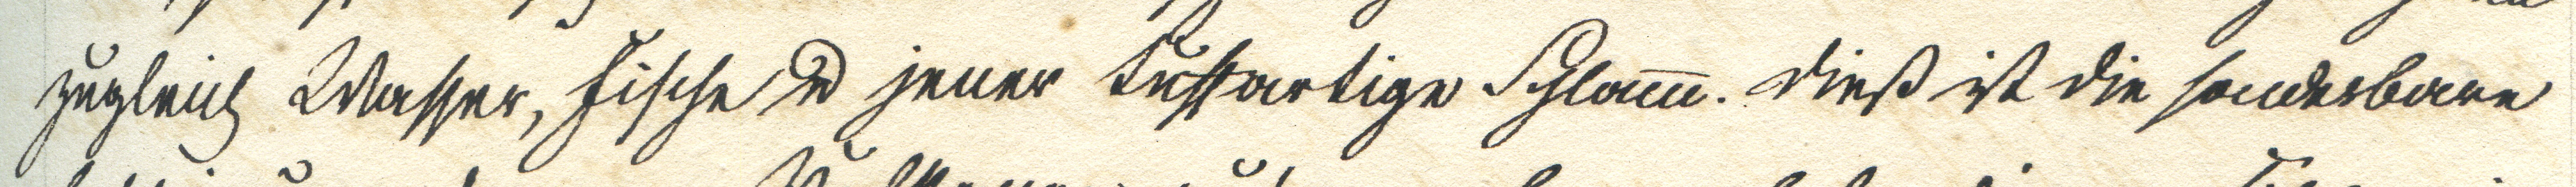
zugleich Wasser, Fische u jener tuffartige Schlam̃. Dieß ist die sonderbare
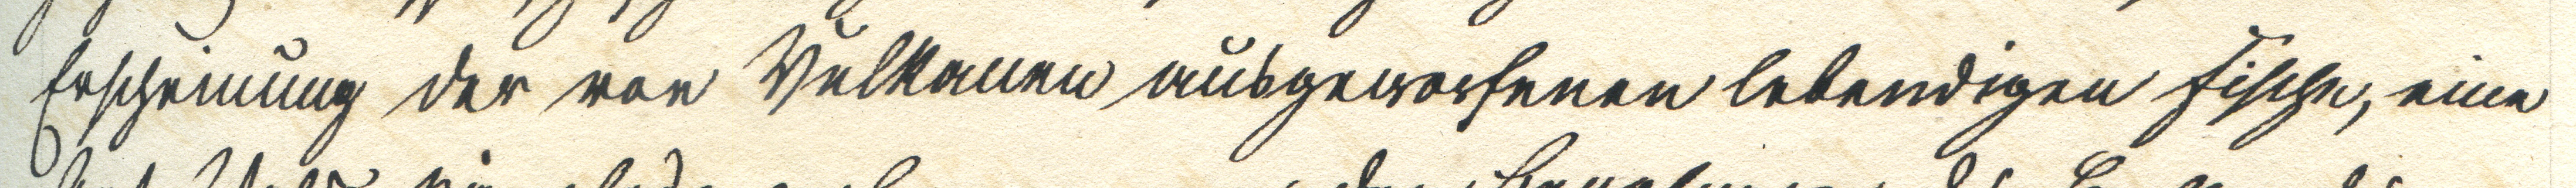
Erscheinung der von Vulkanen ausgeworfenen lebendigen Fische, eine
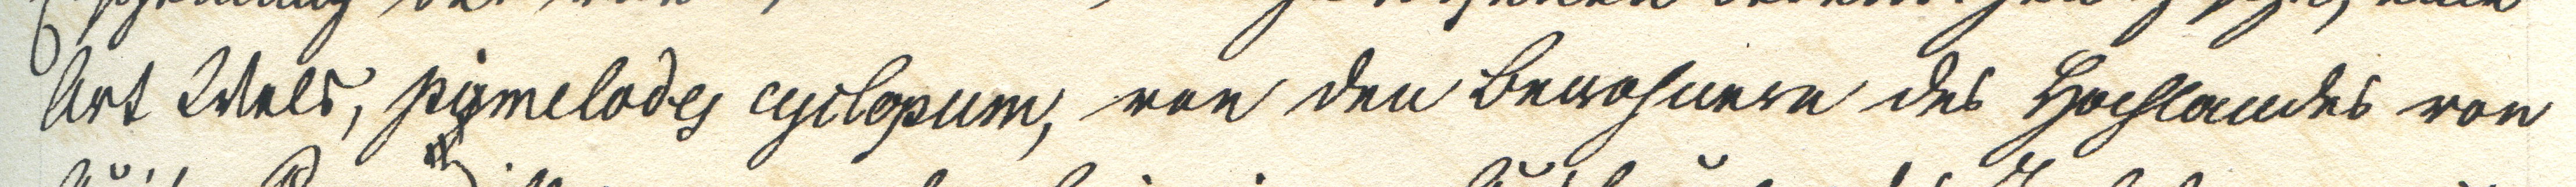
Art Wels, pyimelodes cyclopum, von den Bewohnern des Hochlandes von
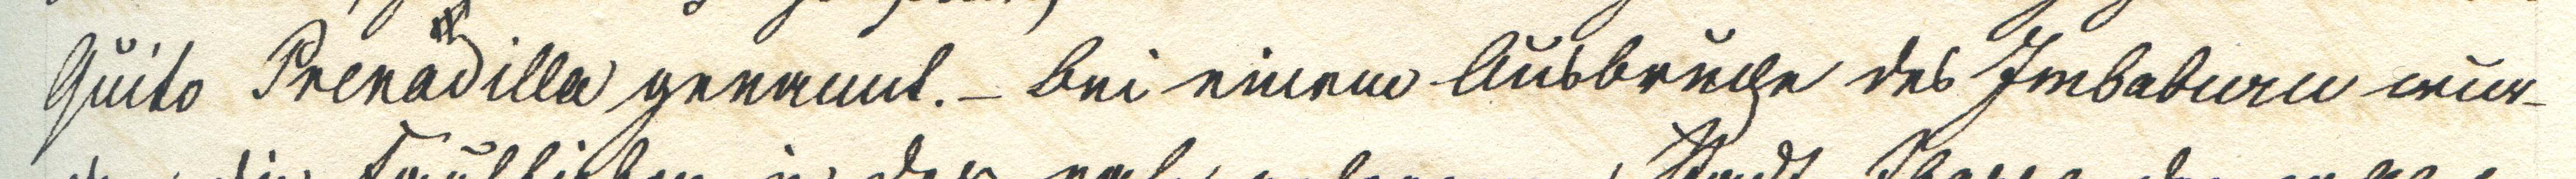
Qũito Prenadilla genannt. – Bei einem Ausbruche des Imbaburu wur-
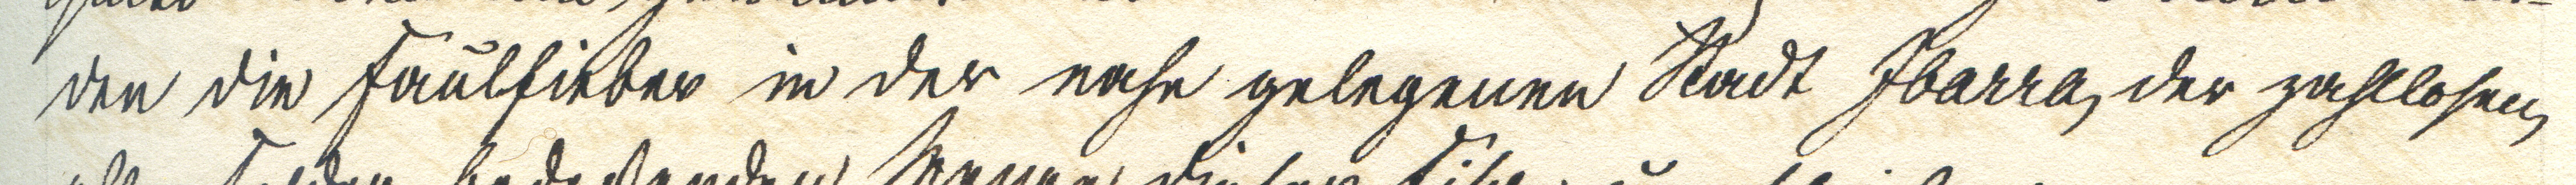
den die Faulfieber in der nahe gelegenen Stadt Ibarra, der zahllosen,
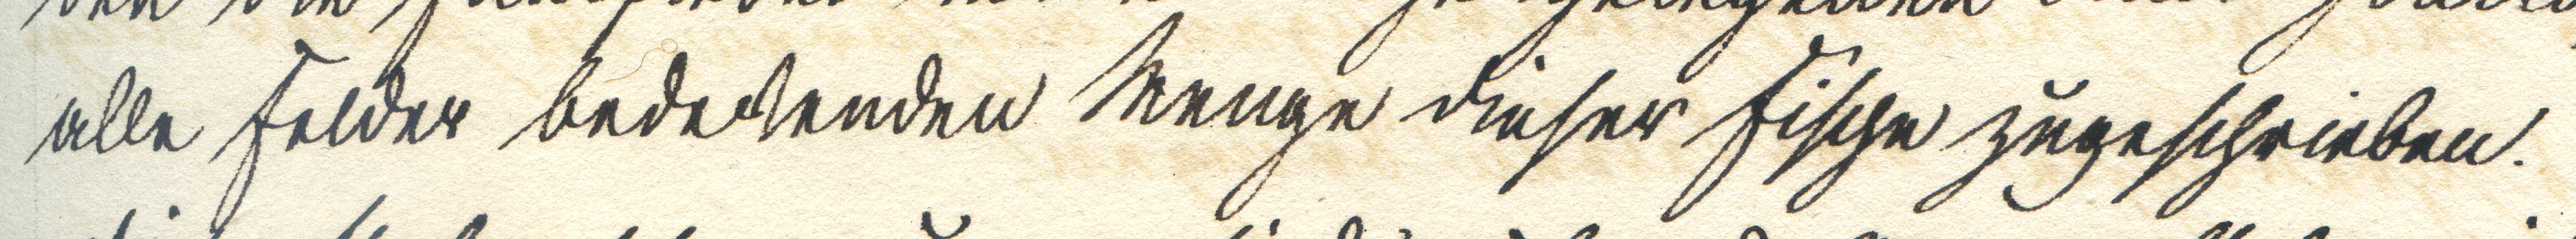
alle Felder bedeckenden Menge dieser Fische zugeschrieben.
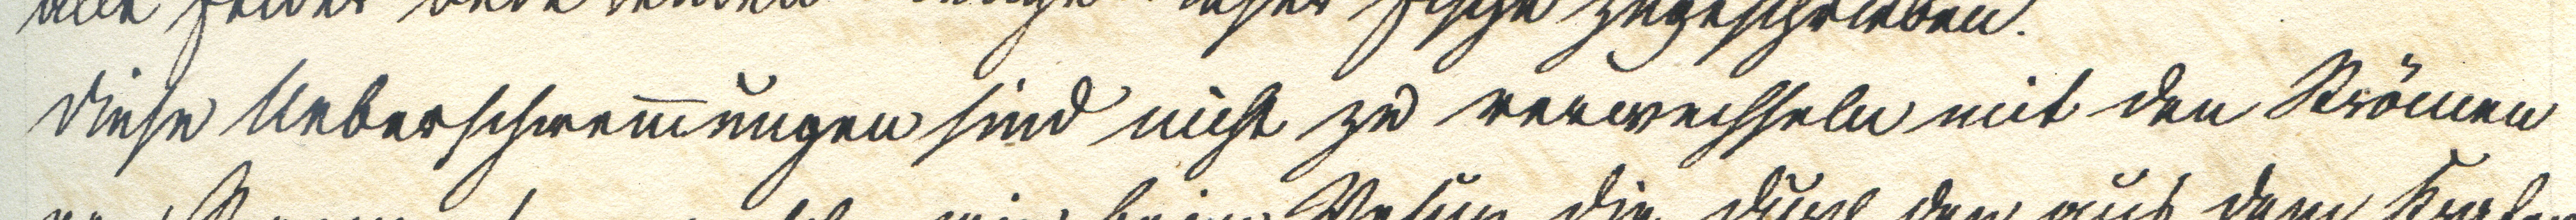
Diese Ueberschwem̃ungen sind nicht zu verwechseln mit den Strömen
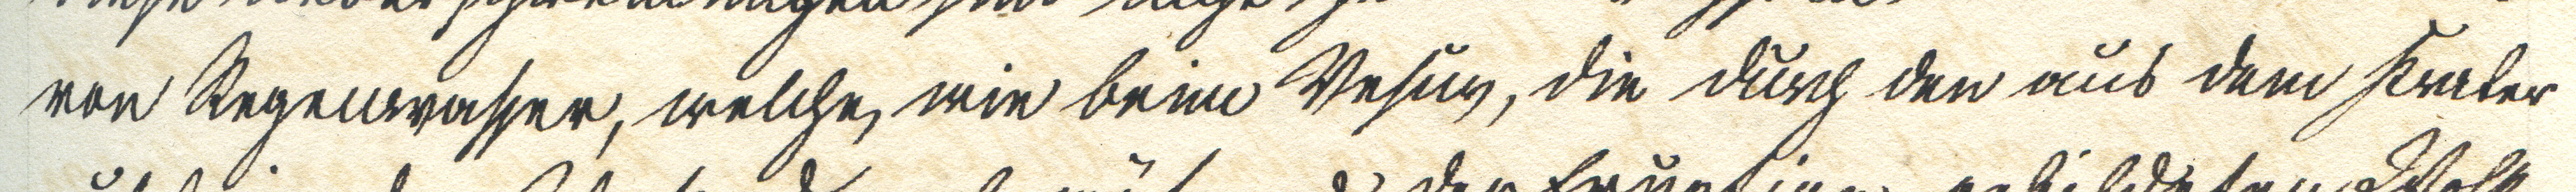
von Regenwasser, welche, wie beim Vesuv, die durch den aus dem Krater
